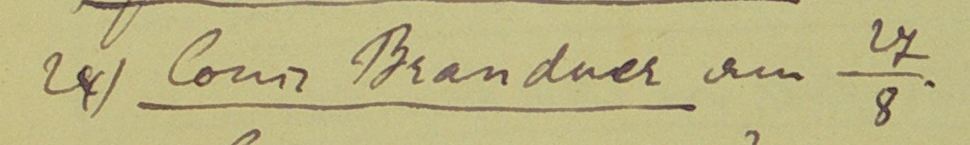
24.) Concert Brandner am 27/8
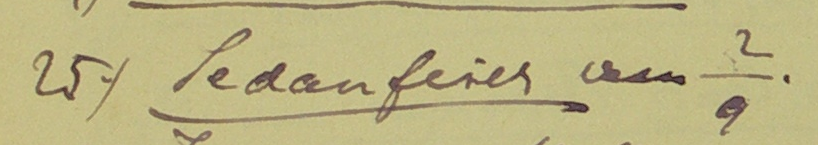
25.) Sedanfeier am 2/9
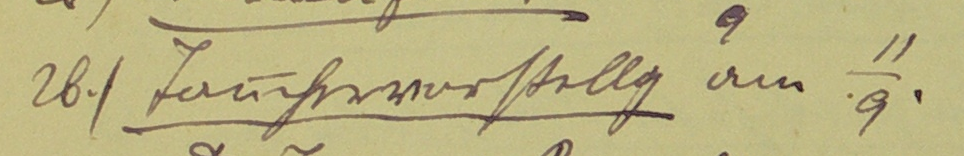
26.) Tauchervorstellung am 11/9
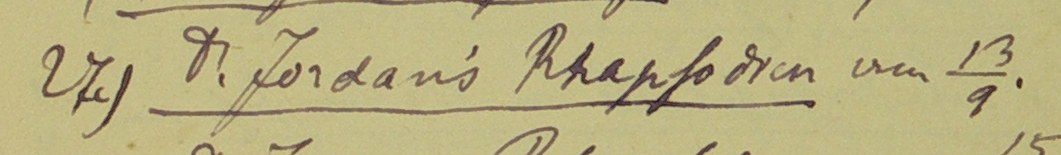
27.) Dr. Jordans Rhapsodien am 13/9
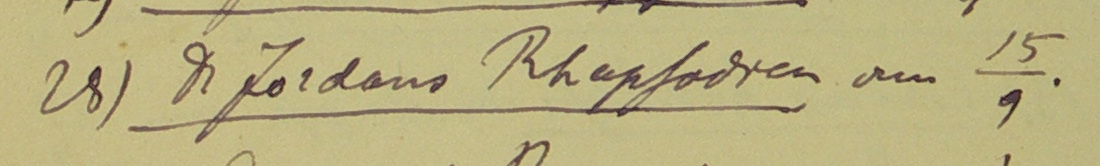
28.) Dr. Jordans Rhapsodien am 15/9
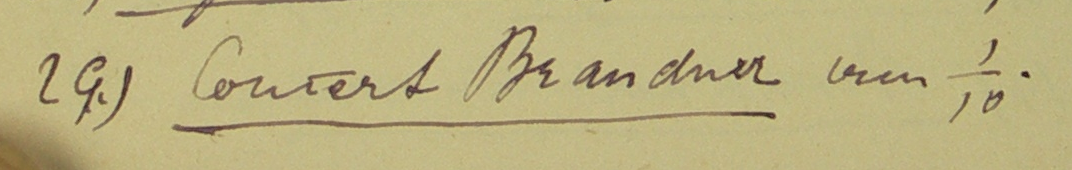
29.) Concert Brandner am 1/10
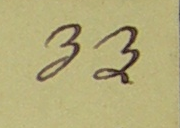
33
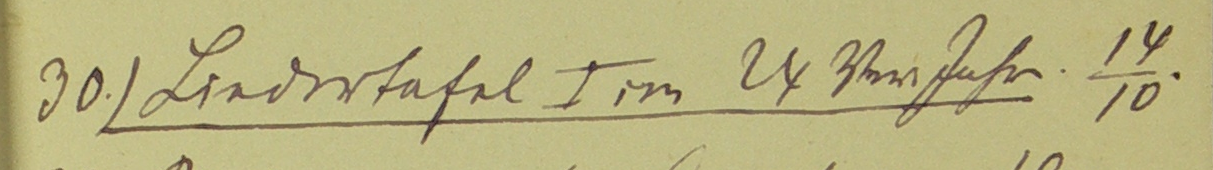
30.) Liedertafel I im 24. Verw. Jahr am 14/10
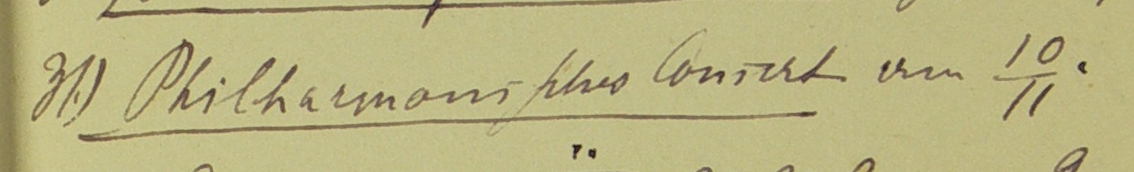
31.) Philharmonisches Concert am 10/11
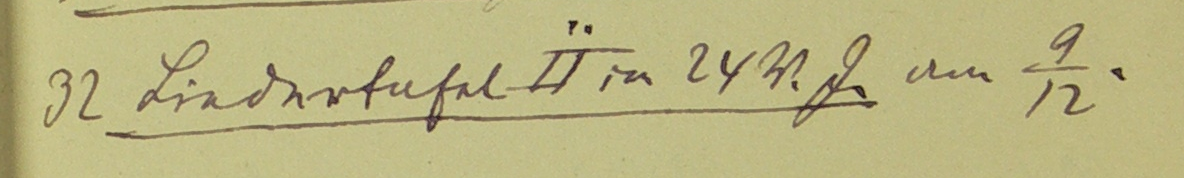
32.) am 9/12
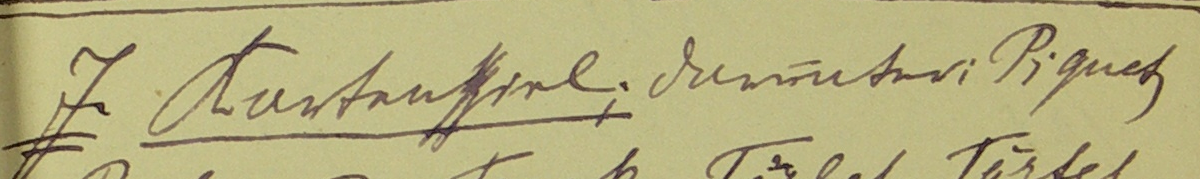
I .) Kartenspiel. Darunter Piquets,
